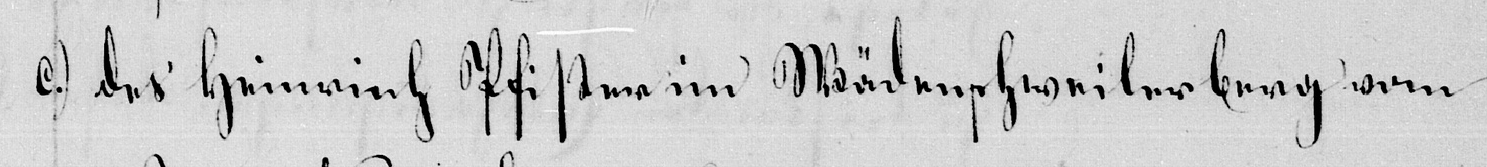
c.) des Heinrich Pfister im Wädenschweilerberg vom
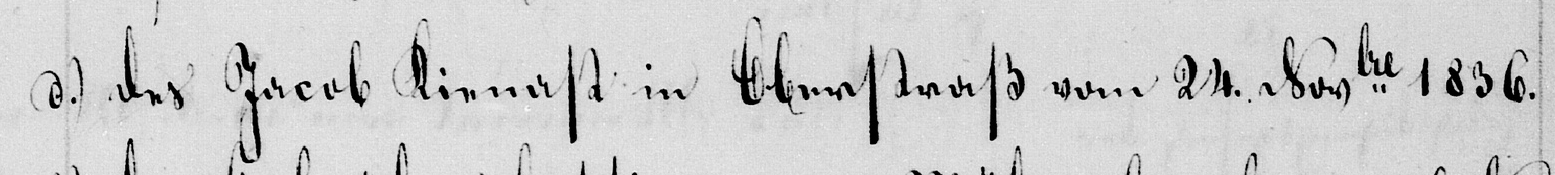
d.) des Jacob Kienast in Oberstraß vom 24. Novbre 1836.
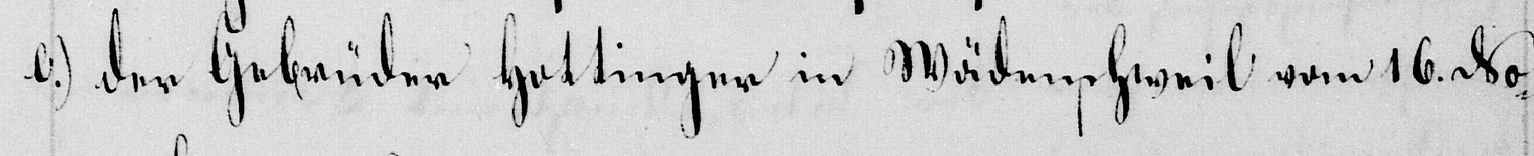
e.) der Gebrüder Hottinger in Wädenschweil vom 16. No¬
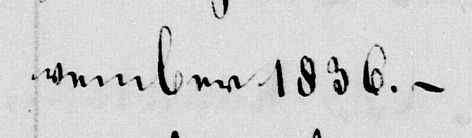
vember 1836. –
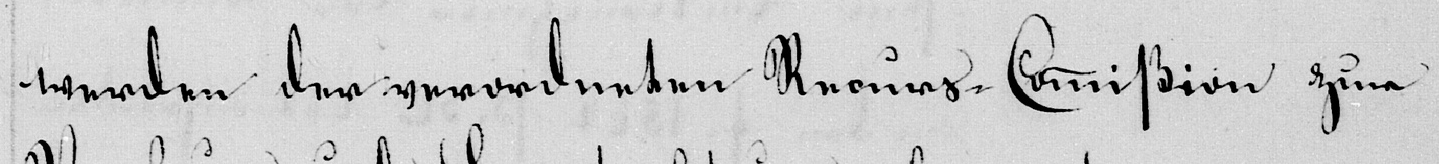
werden der verordneten Recurs-Commißion zur
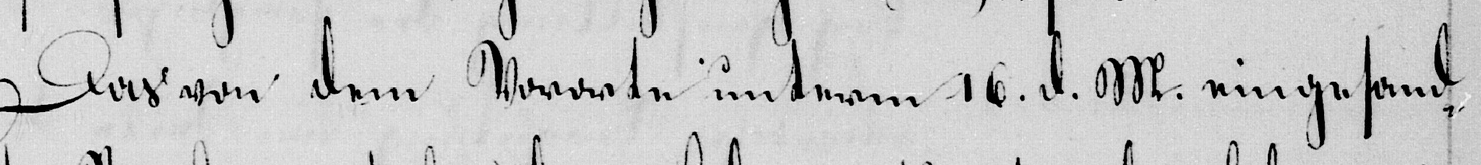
Das von dem Vororte unterm 16. d. M. eingesand¬
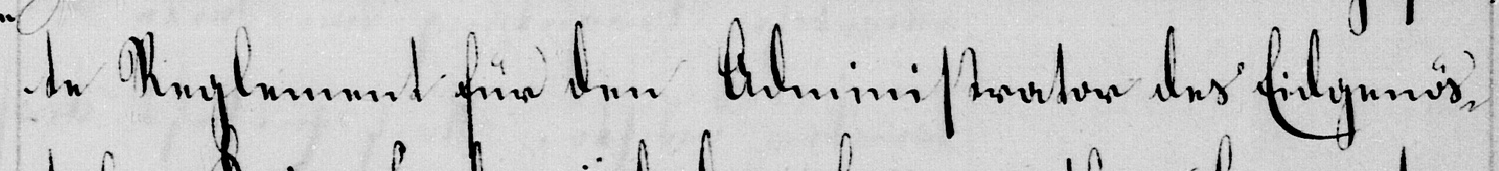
te Reglement für den Administrator des Eidgenöß¬
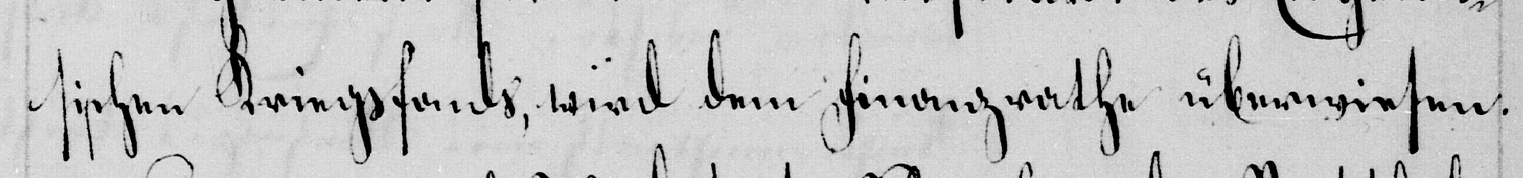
ischen Kriegsfonds, wird dem Finanzrathe überwiesen.
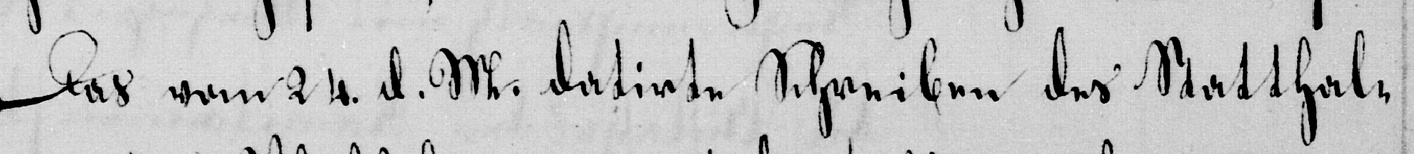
Das vom 24. d. M. datirte Schreiben des Statthal¬
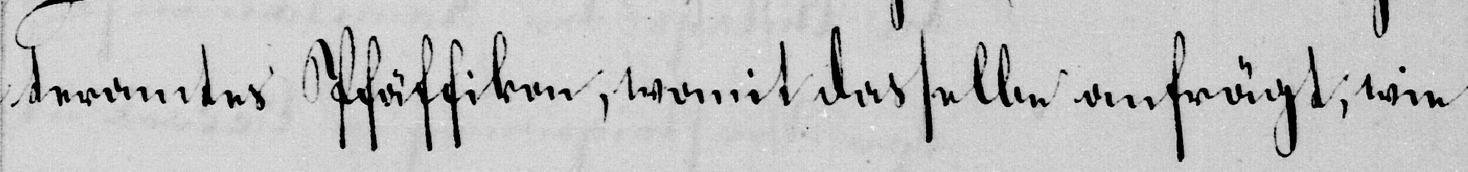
teramtes Pfäffikon, womit dasselbe anfrägt, wie
